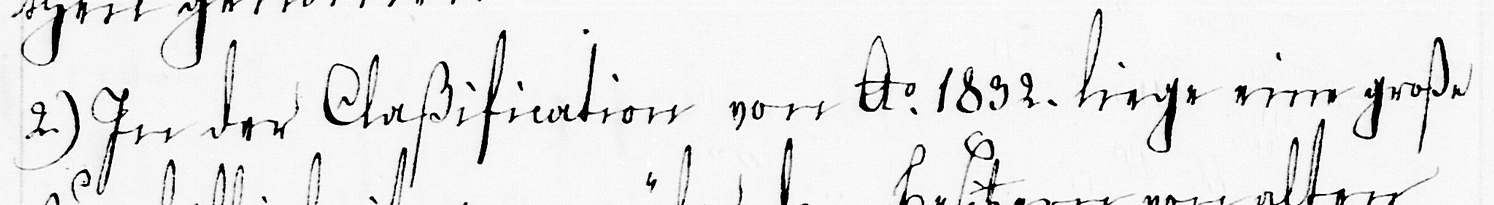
2.) In der Claßification von Ao. 1832. liege eine große
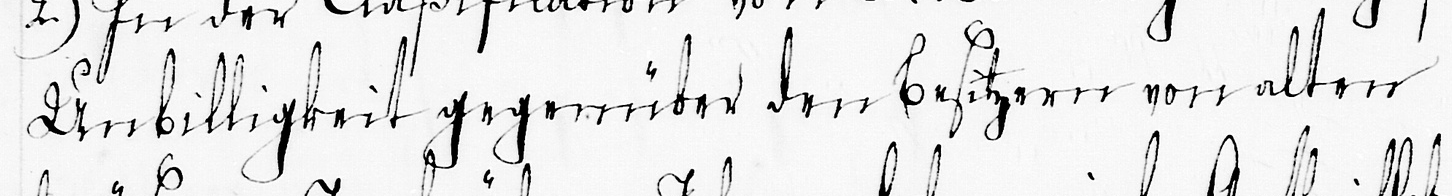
Unbilligkeit gegenüber den Besitzern von allen
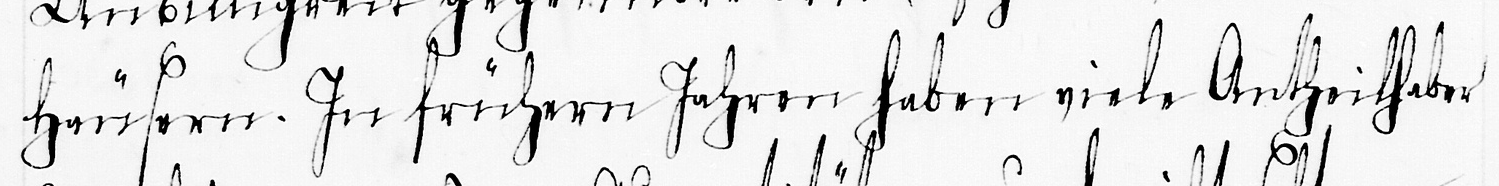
Häusern. In frühern Jahren haben viele Antheilhaber
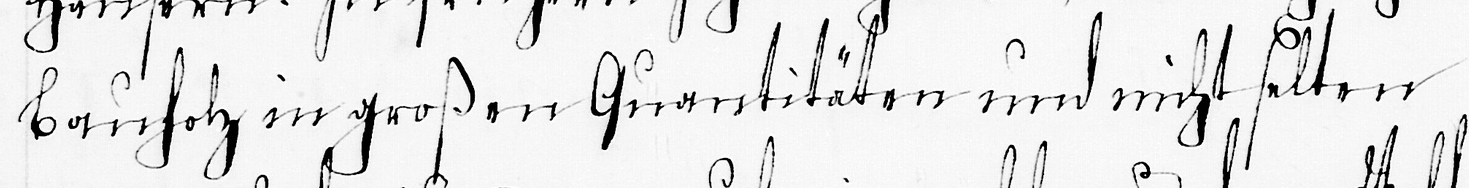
Bauholz in großen Quantitäten und nicht selten
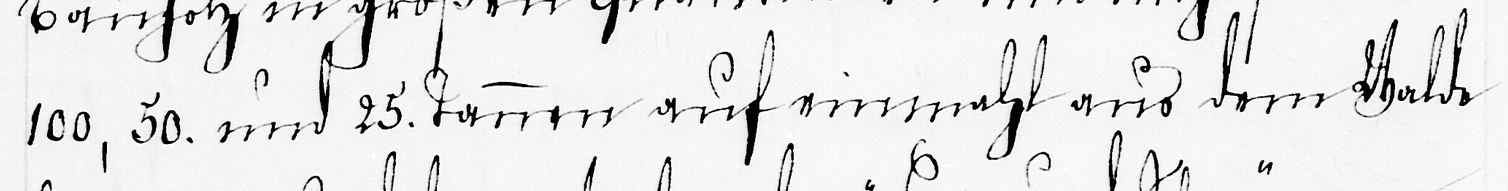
100, 50. und 25. Tannen auf einmahl aus dem Walde
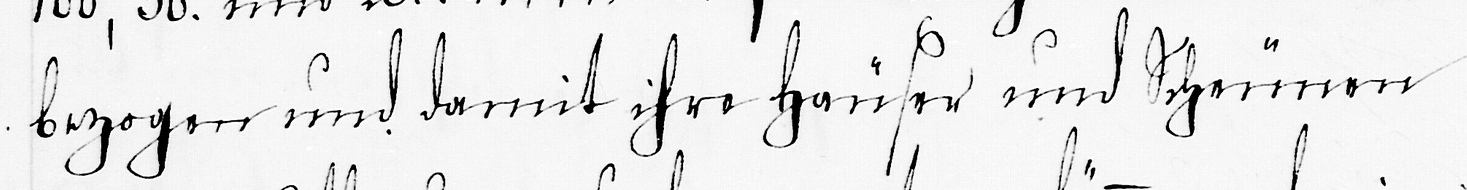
bezogen und damit ihre Häuser und Scheunen
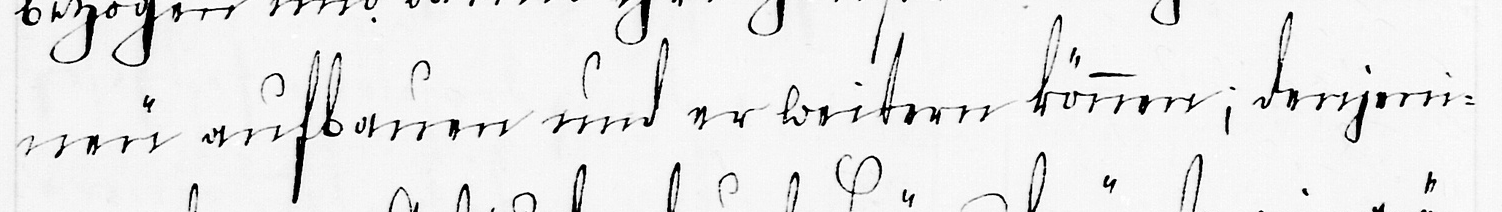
neu aufbauen und erweitern können; denjeni¬
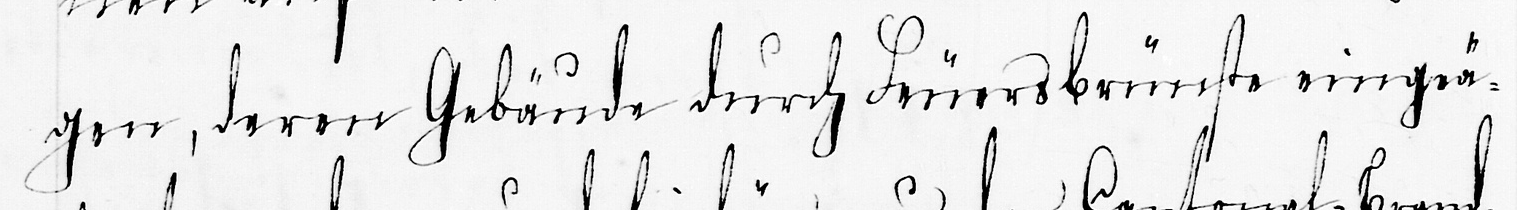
gen, deren Gebäude durch Feuersbrünste eingeä¬
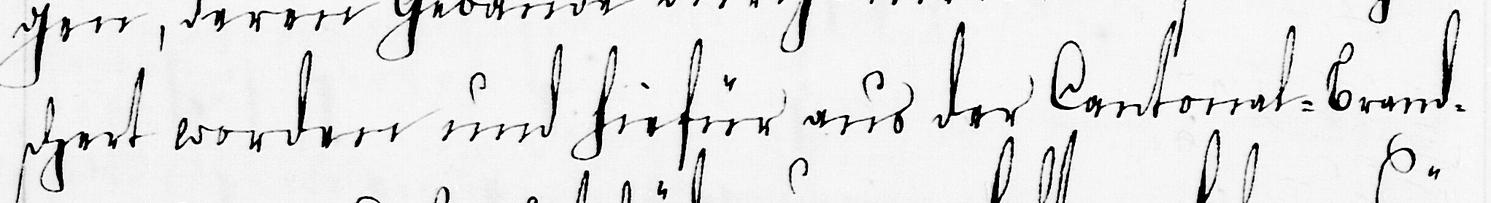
schert worden und hiefür aus der Cantonal-Brand¬
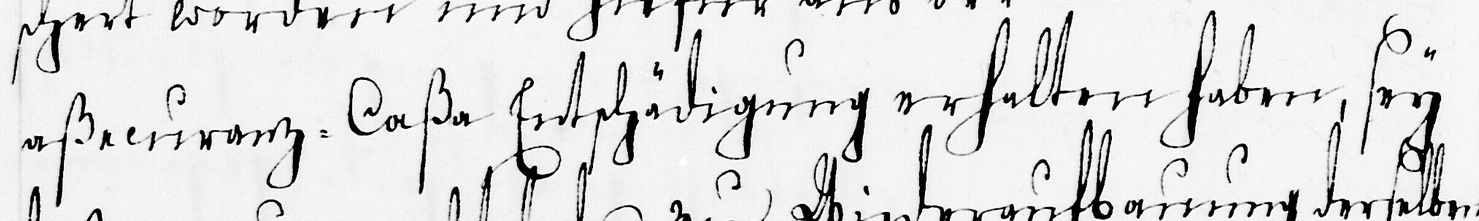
aßecuranz-Caßa Entschädigung erhalten haben, sey
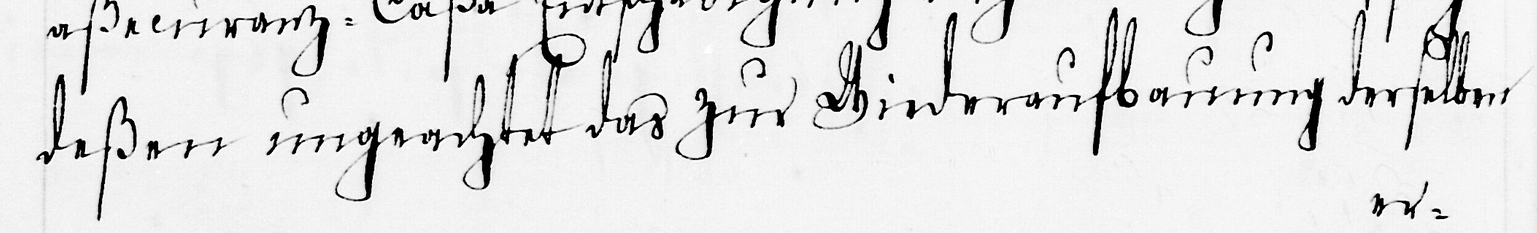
deßen ungeachtet das zur Wiederaufbauung derselben
